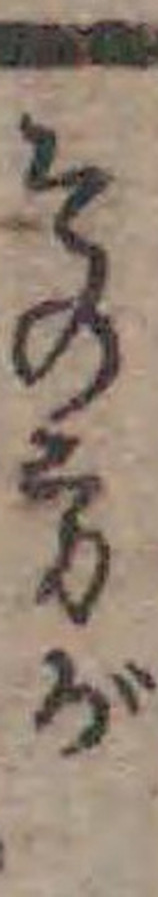その方が
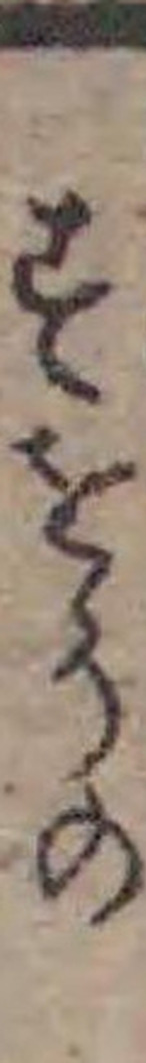すをうの
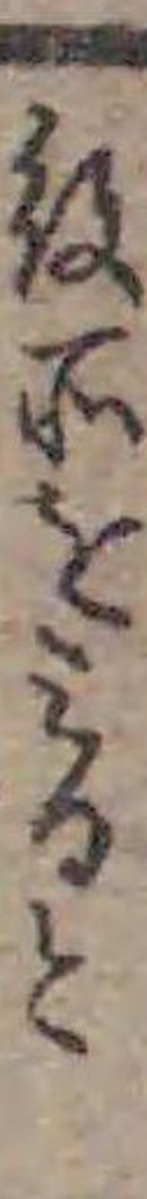紋所をみると
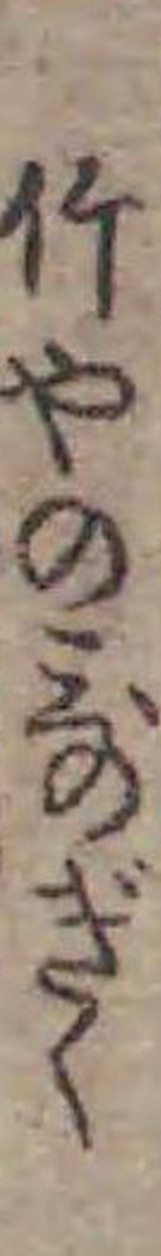竹やの哥ぎく
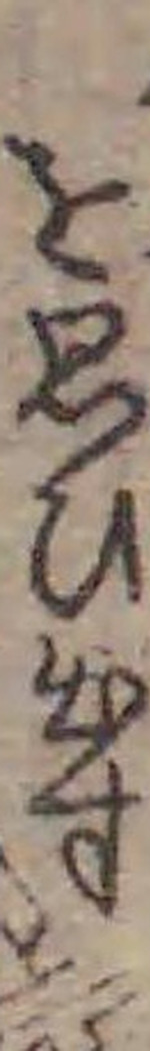を思ひ出す
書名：悪七変目景清 : 2巻
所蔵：国立国会図書館 National Diet Library, JAPAN
